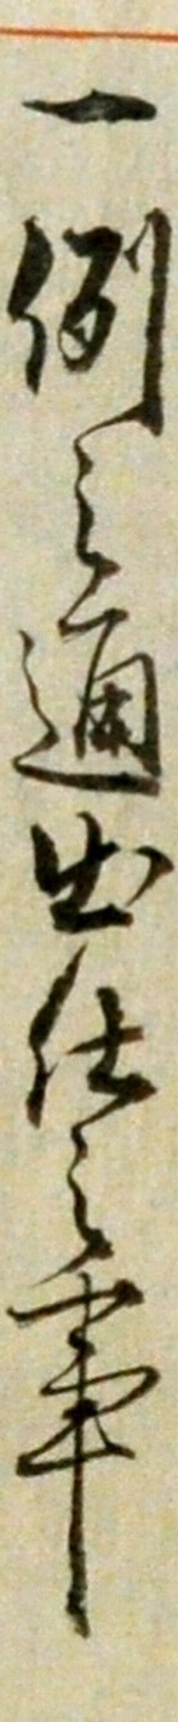一例之通出仕之事
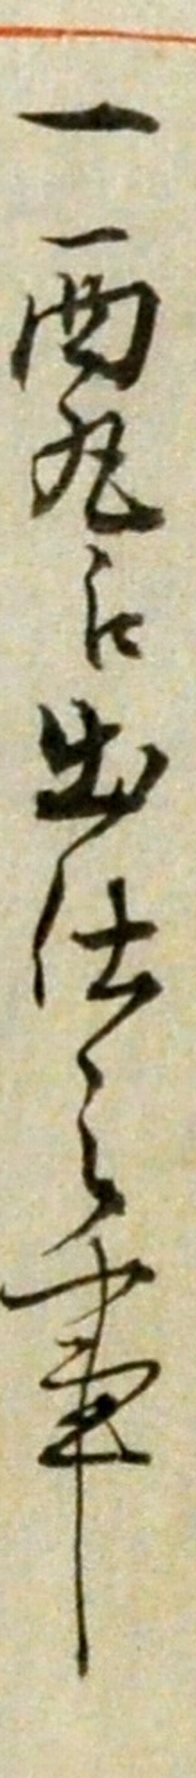一西丸え出仕之事
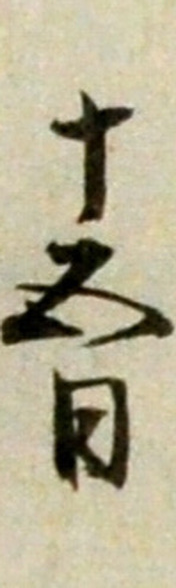十五日
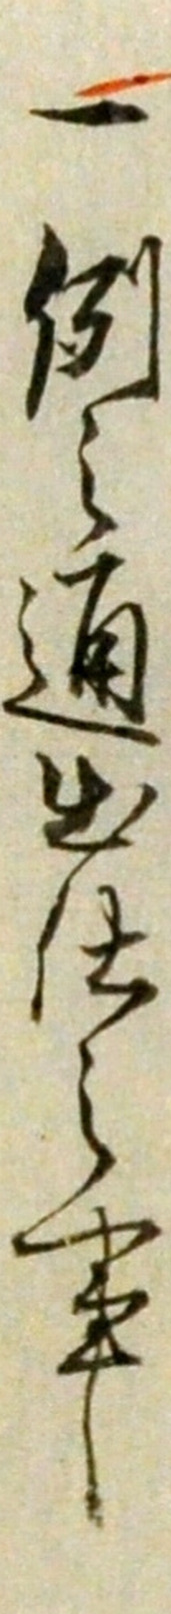一例之通出仕之事
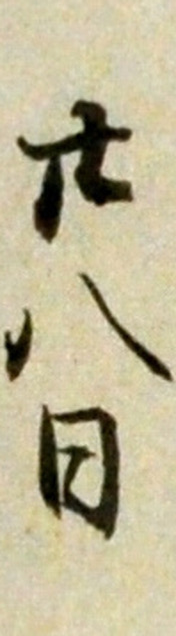廿八日
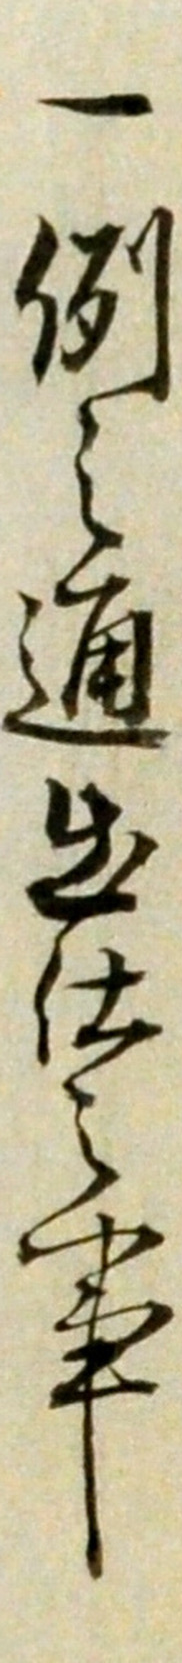一例之通出仕之事
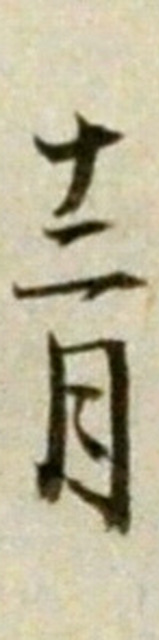十二月
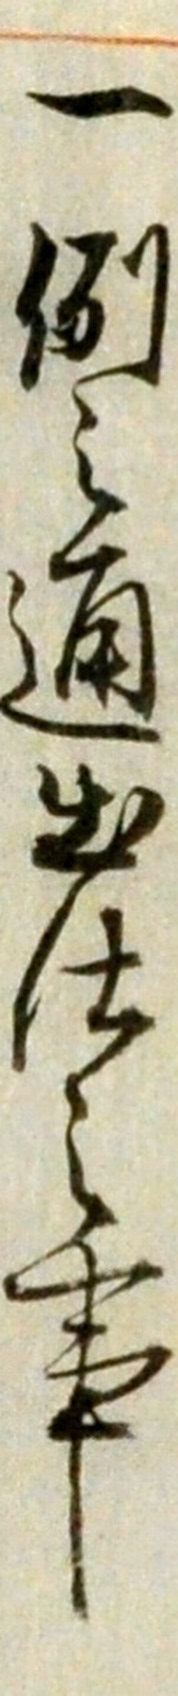一例之通出仕之事
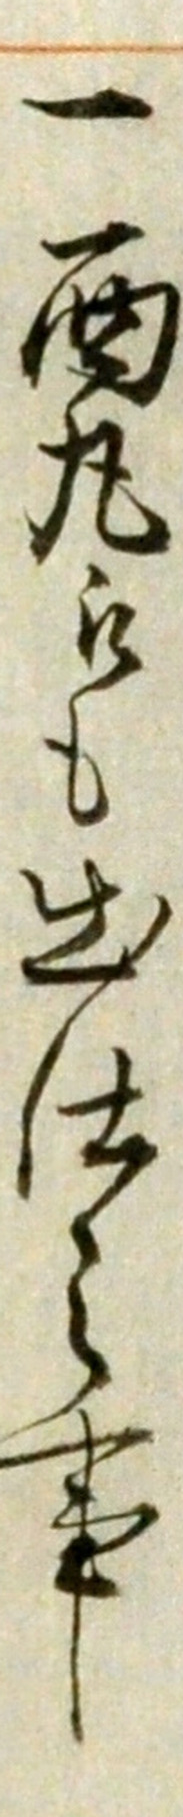一西丸えも出仕之事
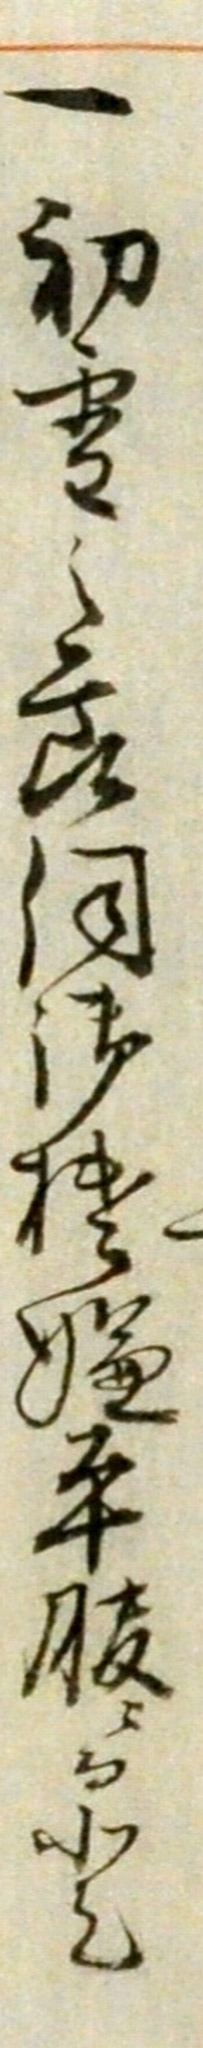一初雪之節伺御機嫌平服にて登
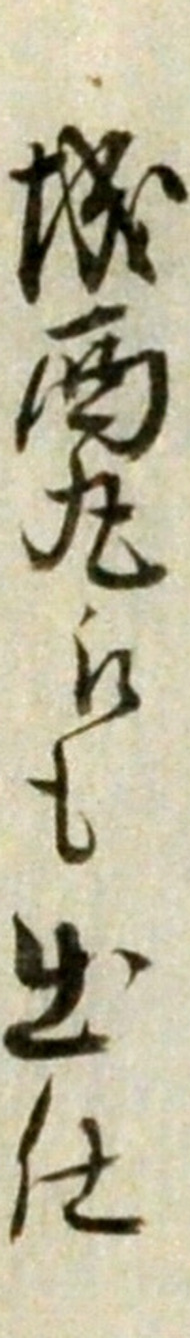城西丸えも出仕
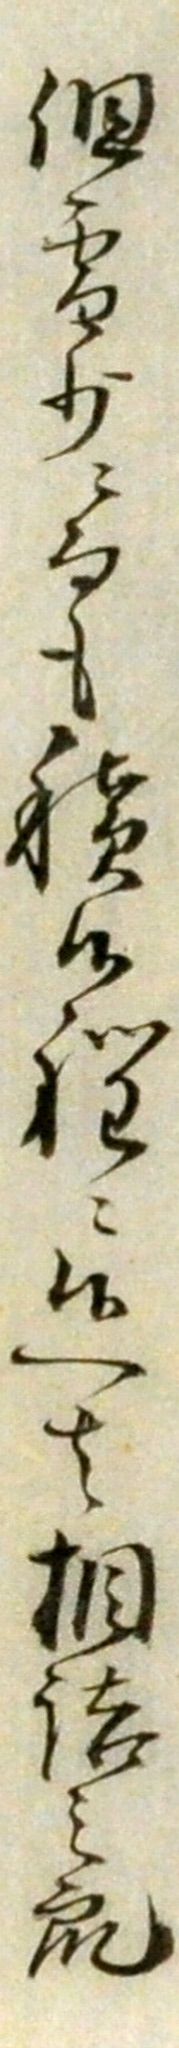但少にても積候程に候へは相詰之衆
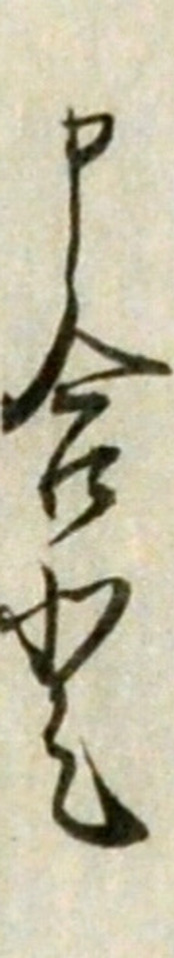申合登
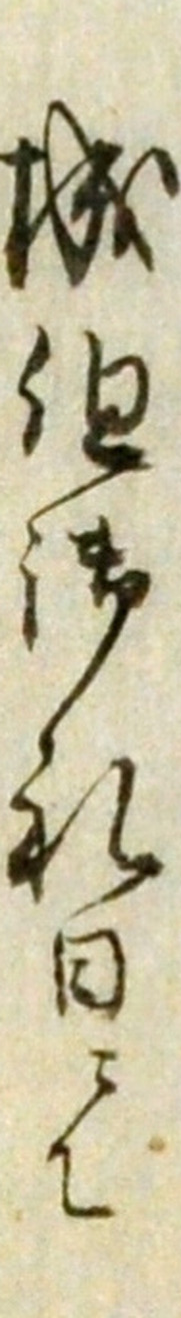城但御礼日にて
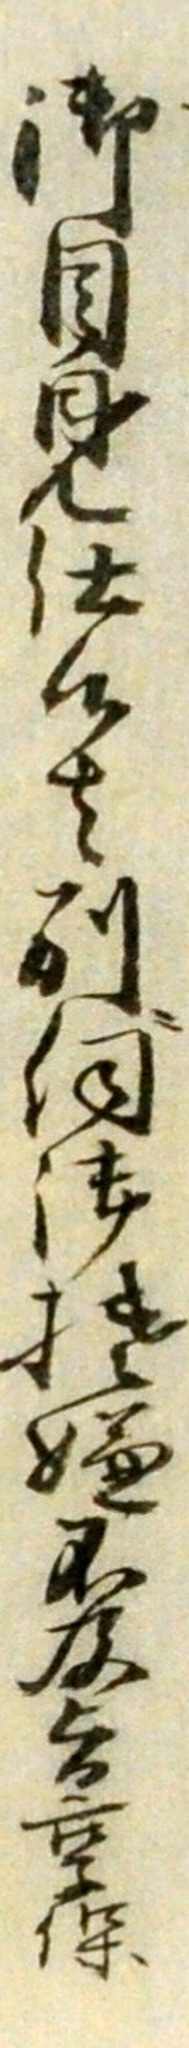御目見仕候は別伺御機嫌不及旨享保
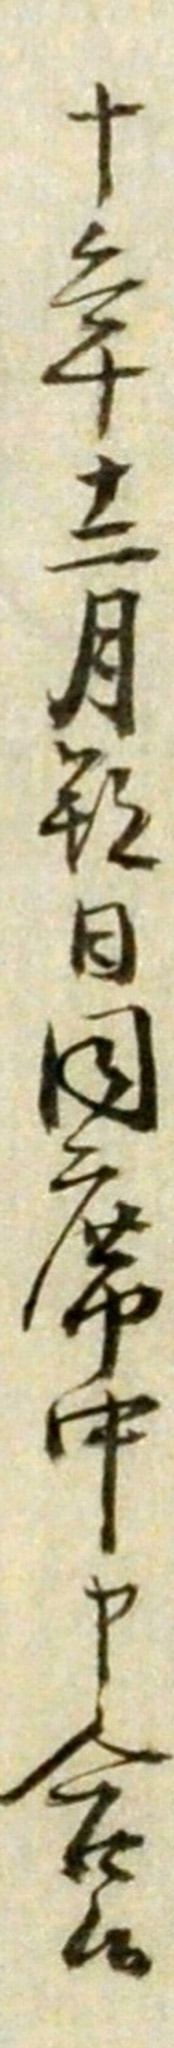十年十二月朔日同席中申合候
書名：申合帳〔一括〕
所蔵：伊那市立高遠町図書館・合同会社AMANE
